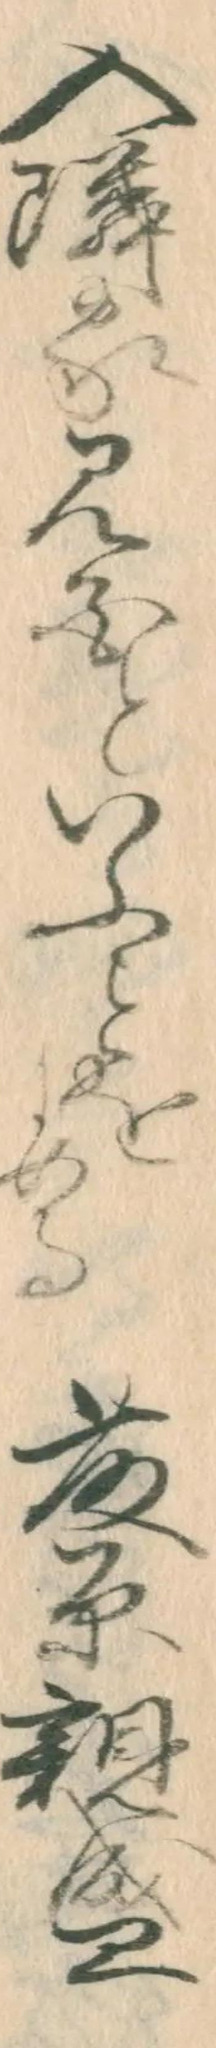入隣家見花といふことを藤原親盛
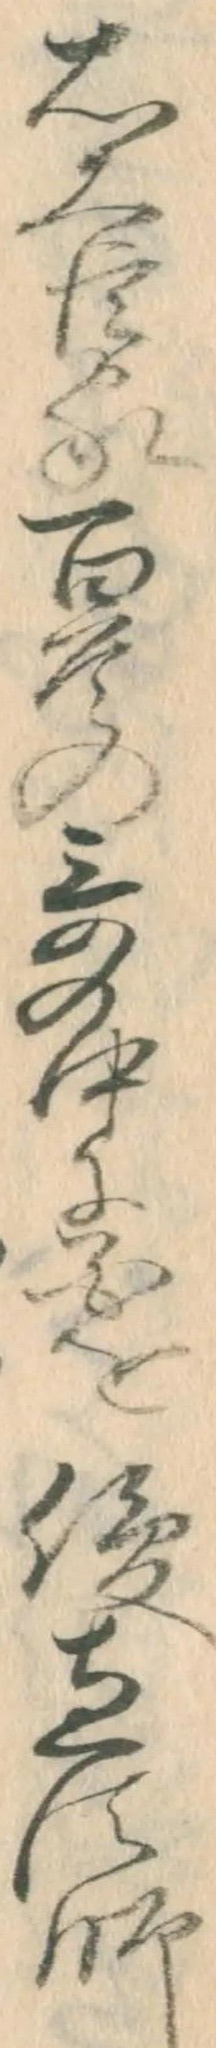右大臣家百首の歌の中に花を俊直法師

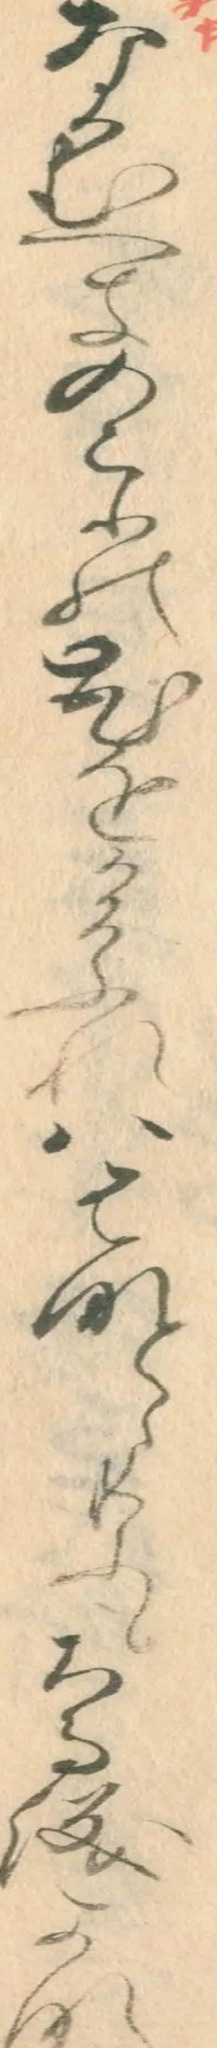なかむへきのこりの花をかそふれははなとゝもにもちる涙かな
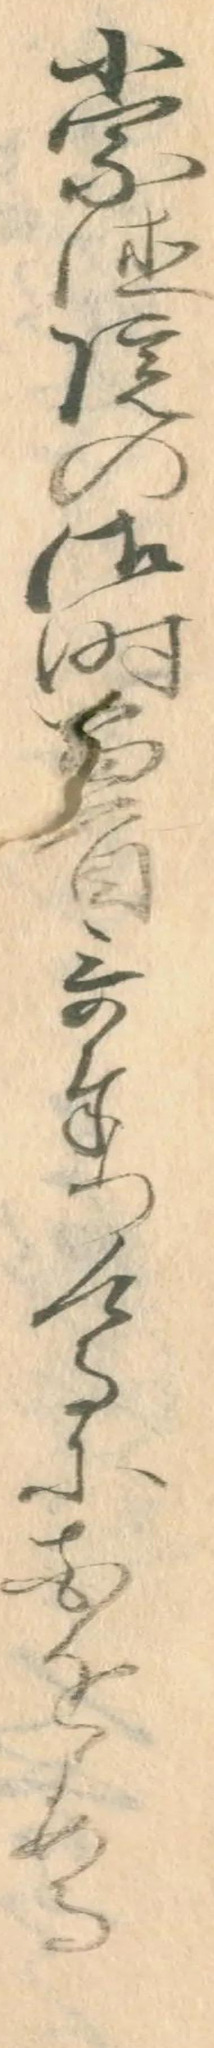崇徳院の御時百首歌奉りけるに花をよめる
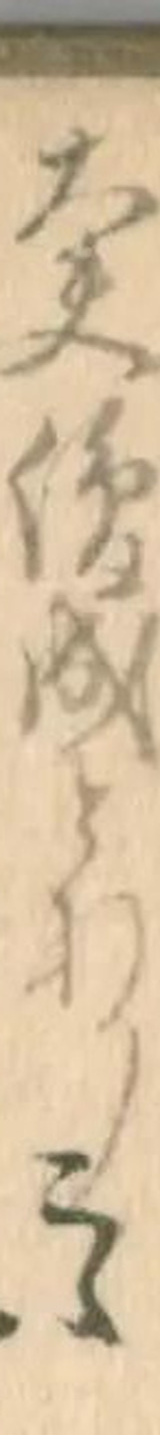大夫俊成とありこゝ
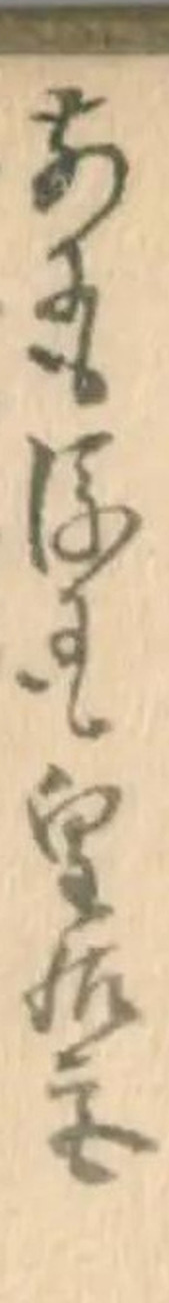前にも後にも皇后宮
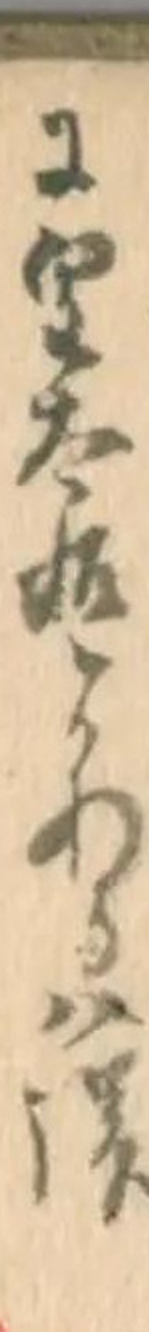に皇太后とあるは誤
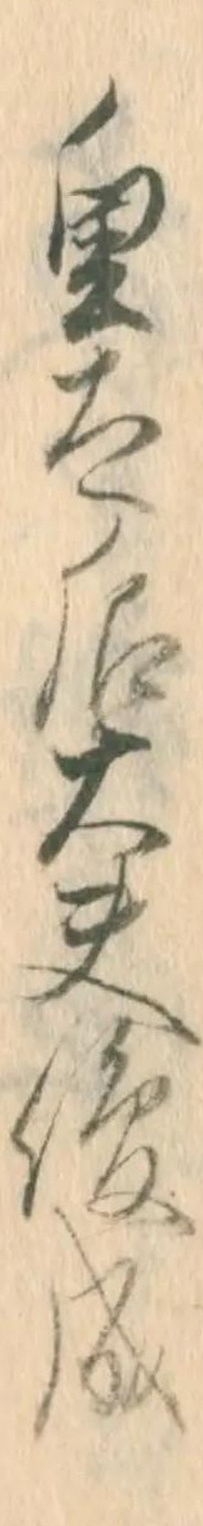皇太后大夫俊成
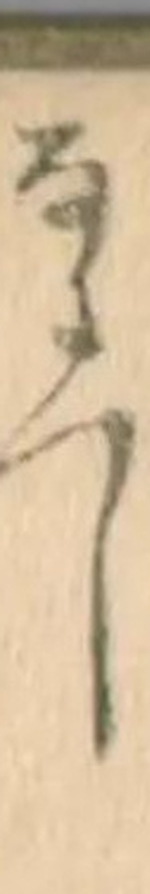なるへし
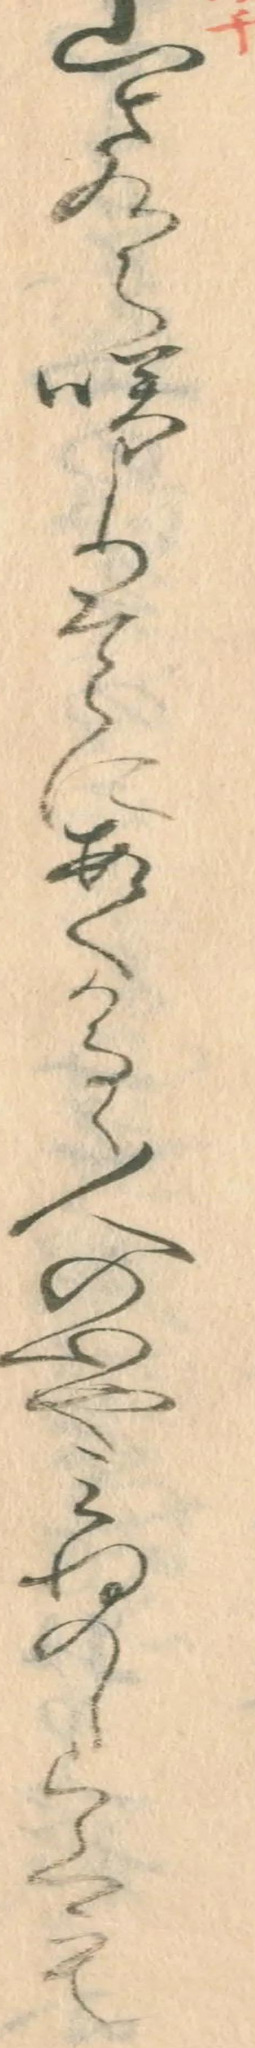山さくら咲よりそらにあくかるゝ人の心やみねのしらくも
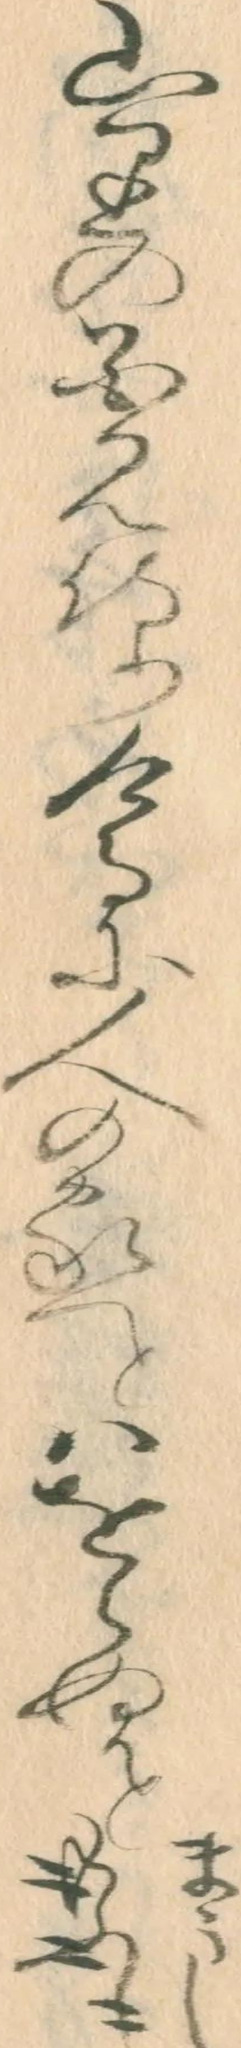山里の花見侍りけるに人の家つとはをらぬかともふし
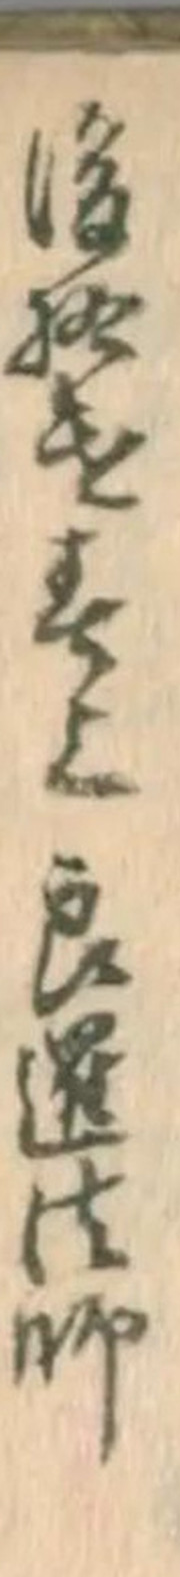後拾遺春上良邏法師
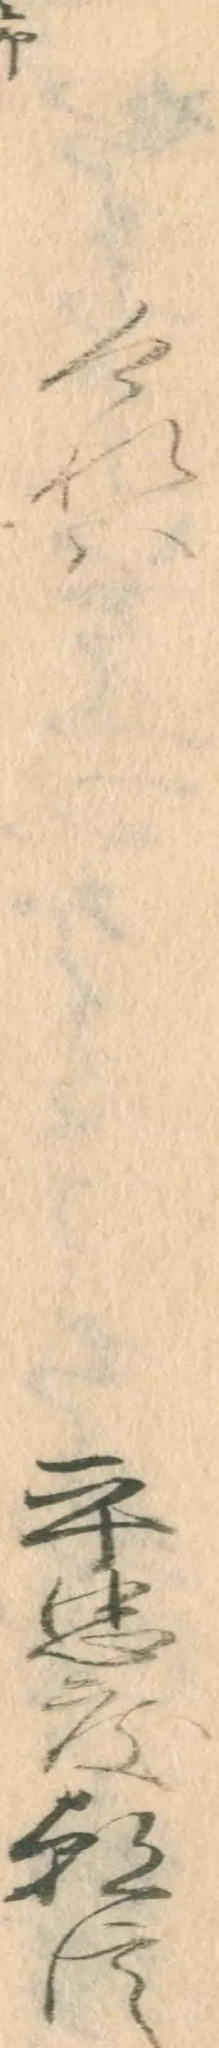けれは平忠度朝臣
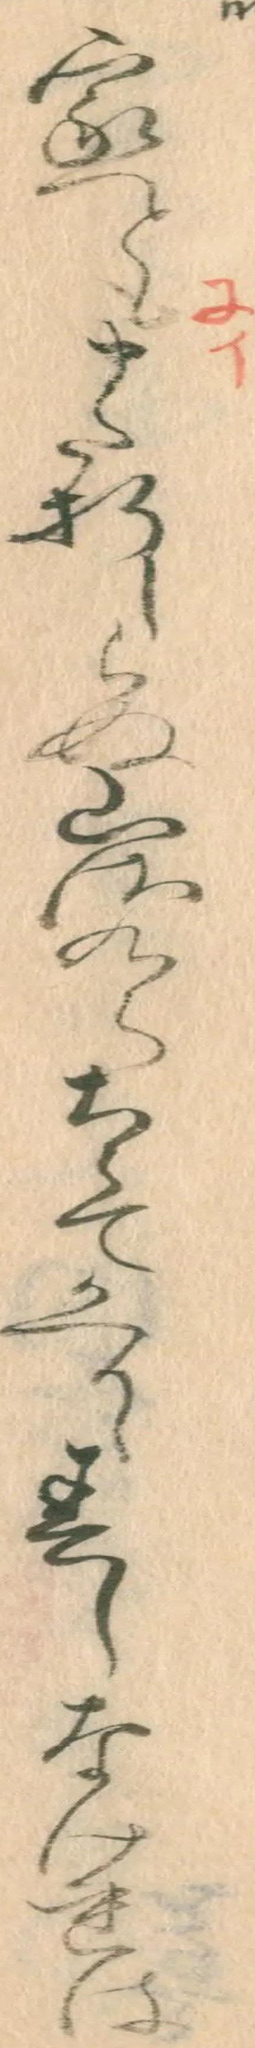家つともまた折しらぬ山さくらちらてかへりし春しなけれは
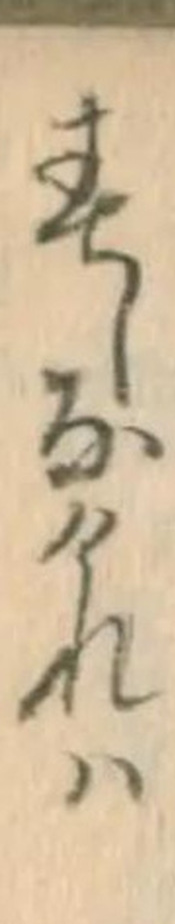春しなけれは
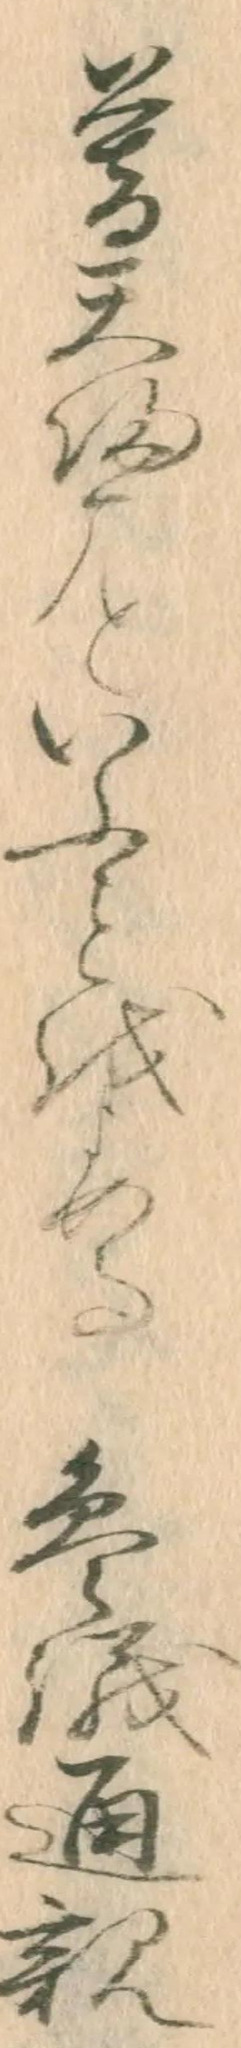暮天帰雁といふことをよめる参議通親
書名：月詣和歌集
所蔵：国立国会図書館 National Diet Library, JAPAN
